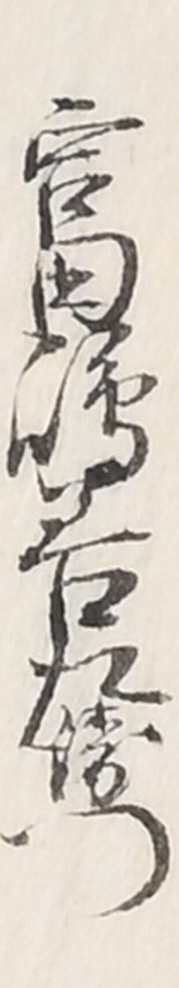富嶋善左衛門
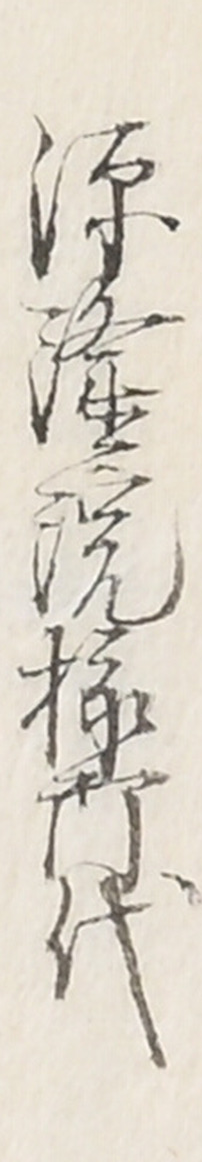源隆院様御代
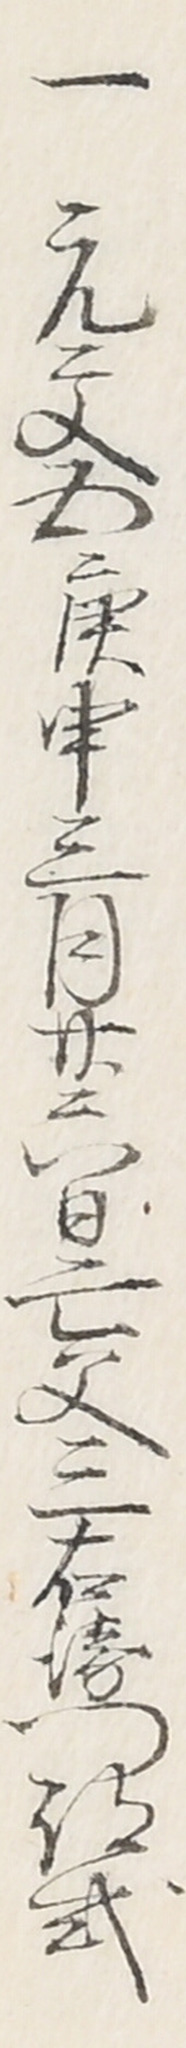一元文五庚申三月廿六日亡父三右衛門跡式
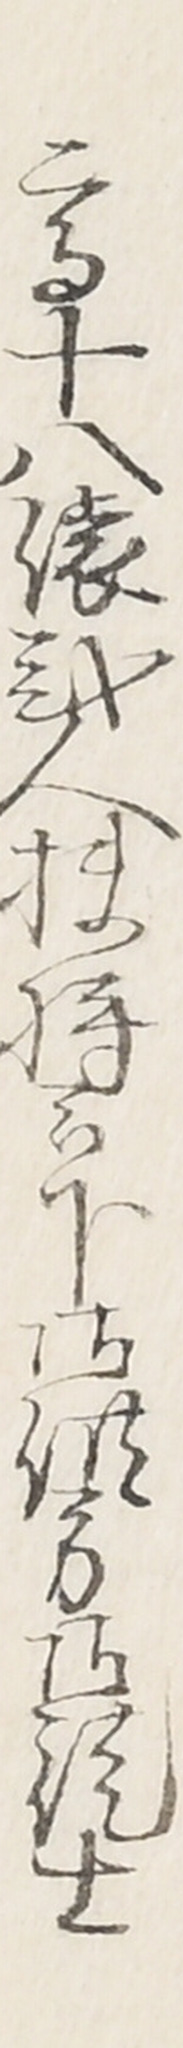高十八俵弐人扶持被下御供方御徒士
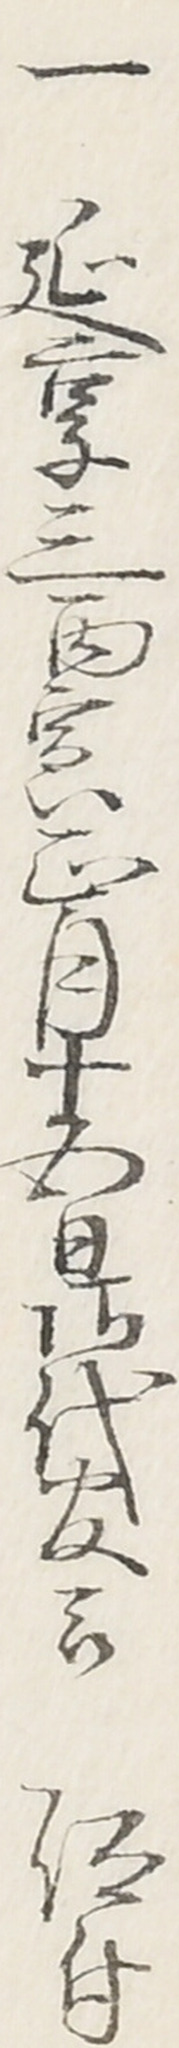一延享三丙寅正月十五日御代官被仰付
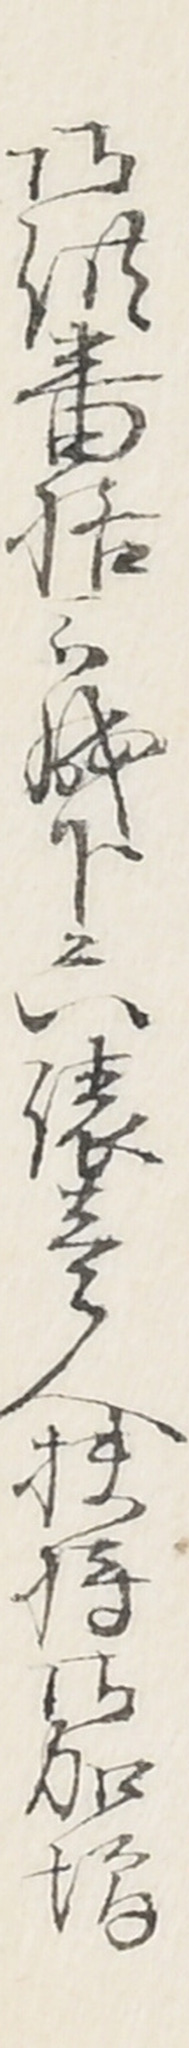御供番格被成下六俵壱人扶持御加増
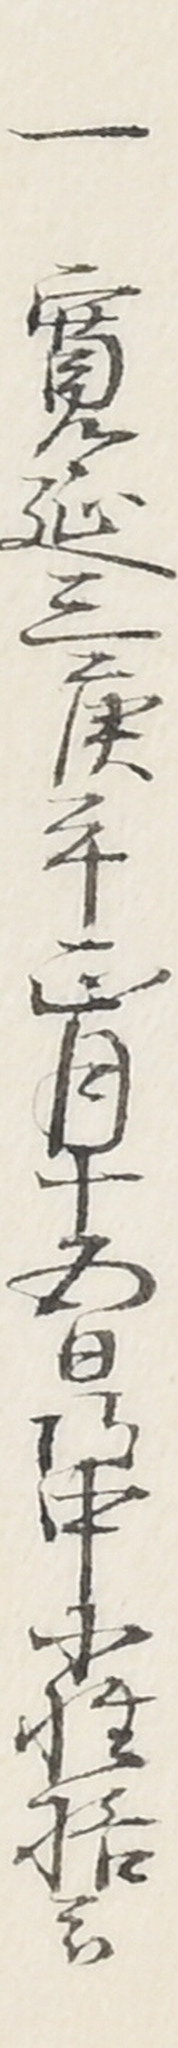一寛延三庚午正月十五日御中小性格被
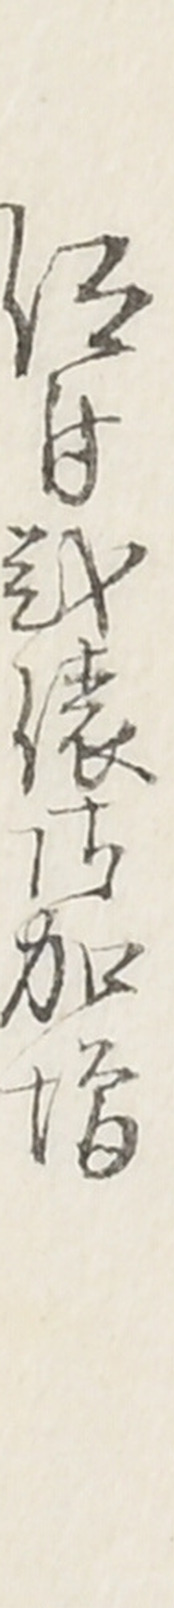仰付弐俵御加増
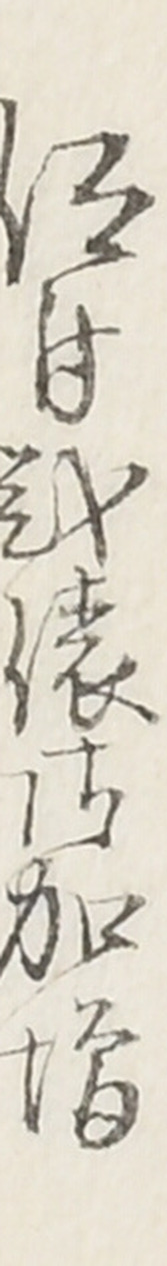仰付弐俵御加増
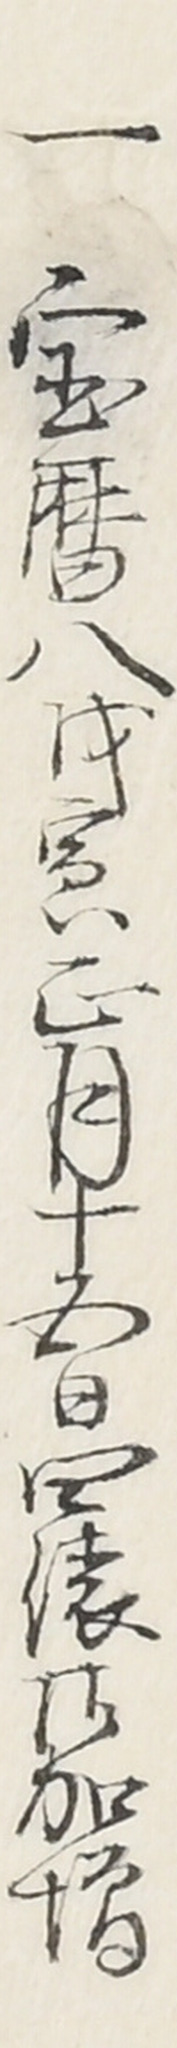一宝暦八戊寅正月十五日四俵御加増
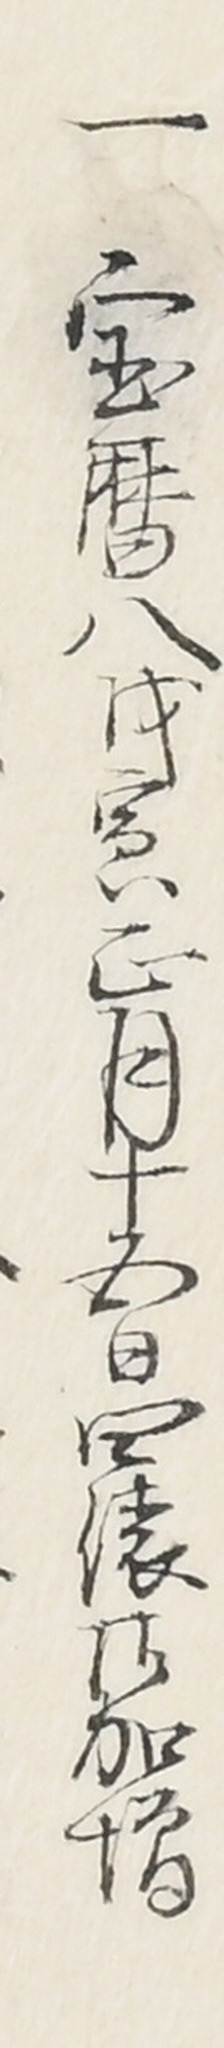一宝暦八戊寅正月十五日四俵御加増
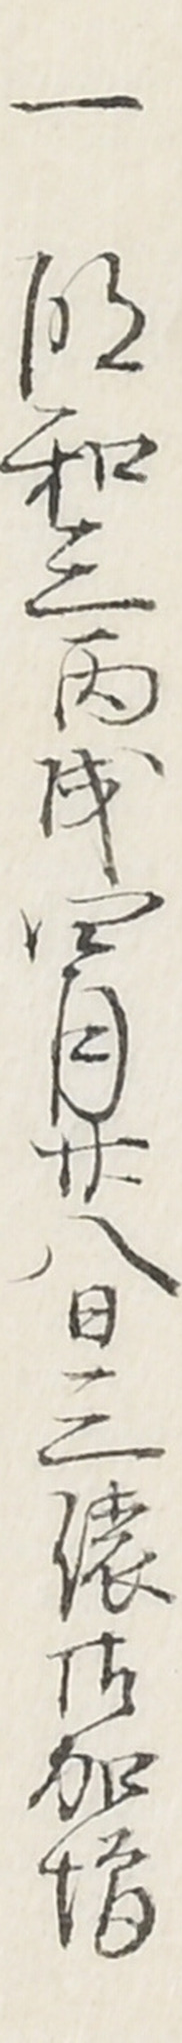一明和三丙戌四月廿八日三俵御加増
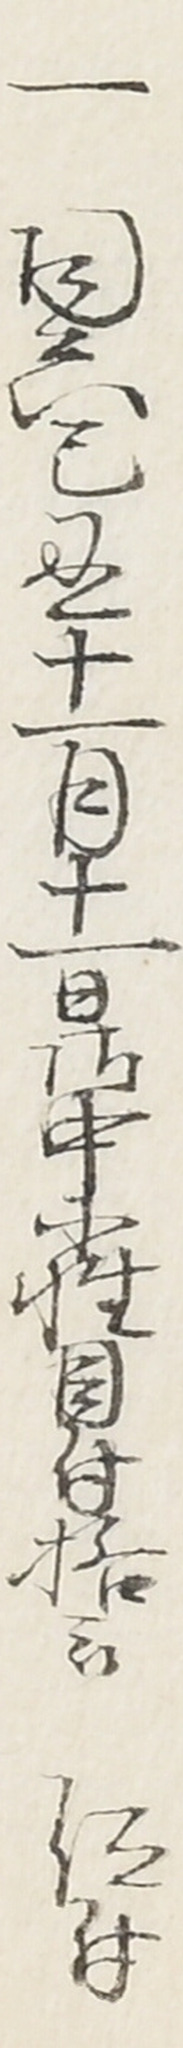一同六己丑十一月十一日御中小性目付格被仰付
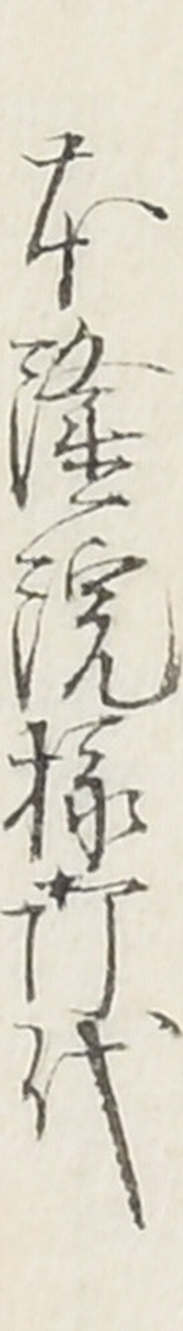本隆院様御代
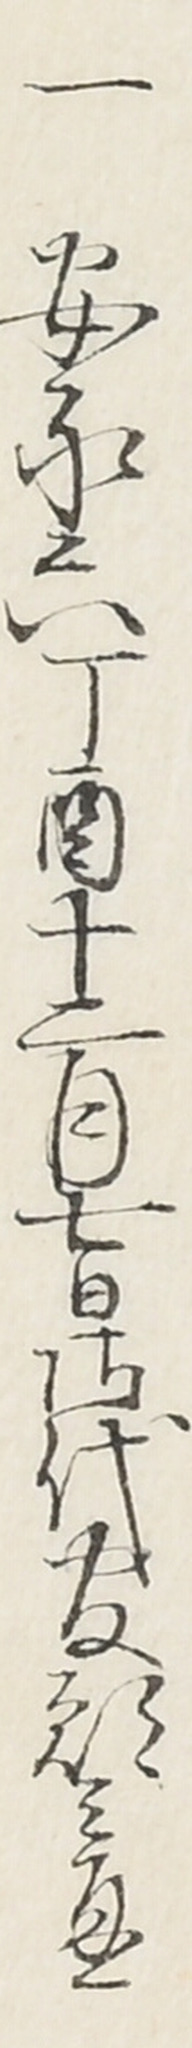一安永六丁酉十二月七日御代官願之通
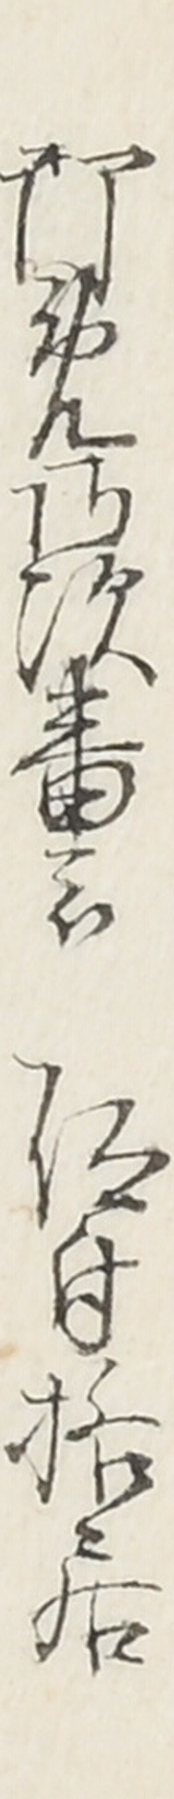御免御次番被仰付格居
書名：無足諸士勤仕録（四）
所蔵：伊那市立高遠町図書館・合同会社AMANE
